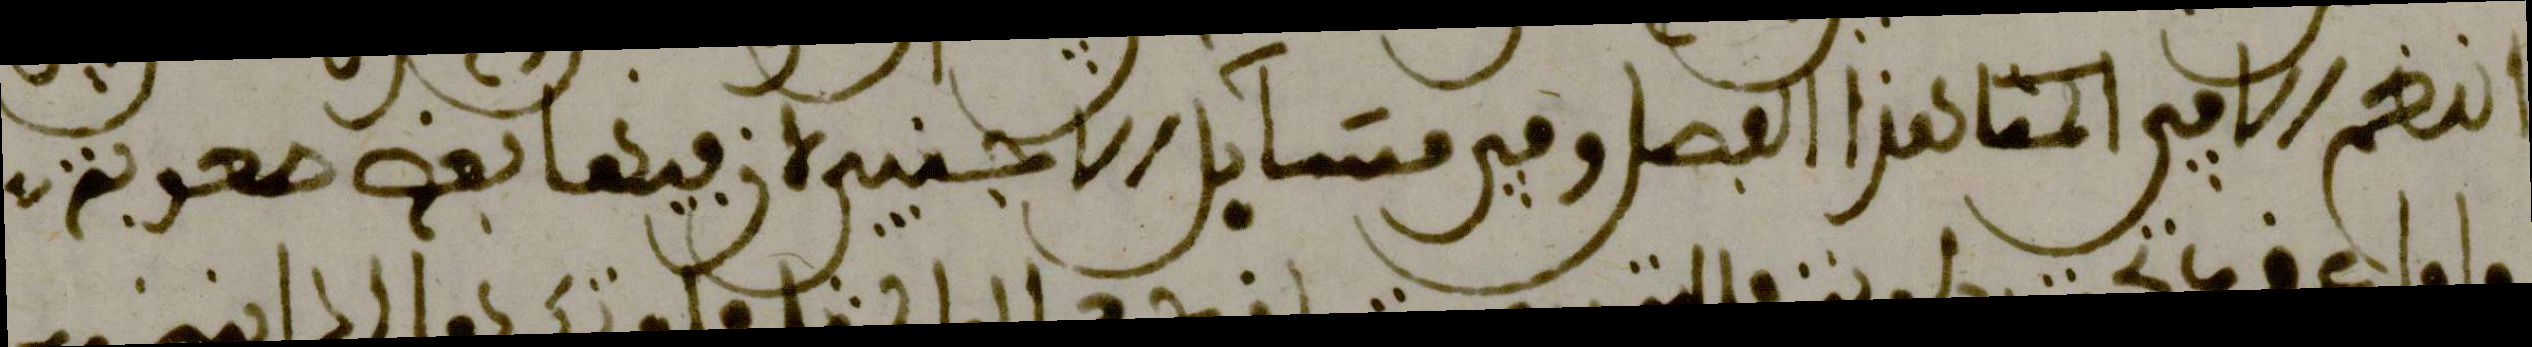النظم الا في المثا هذا الفصل وفي مسَائل الاجنبي لان فيها بعض صعوبة
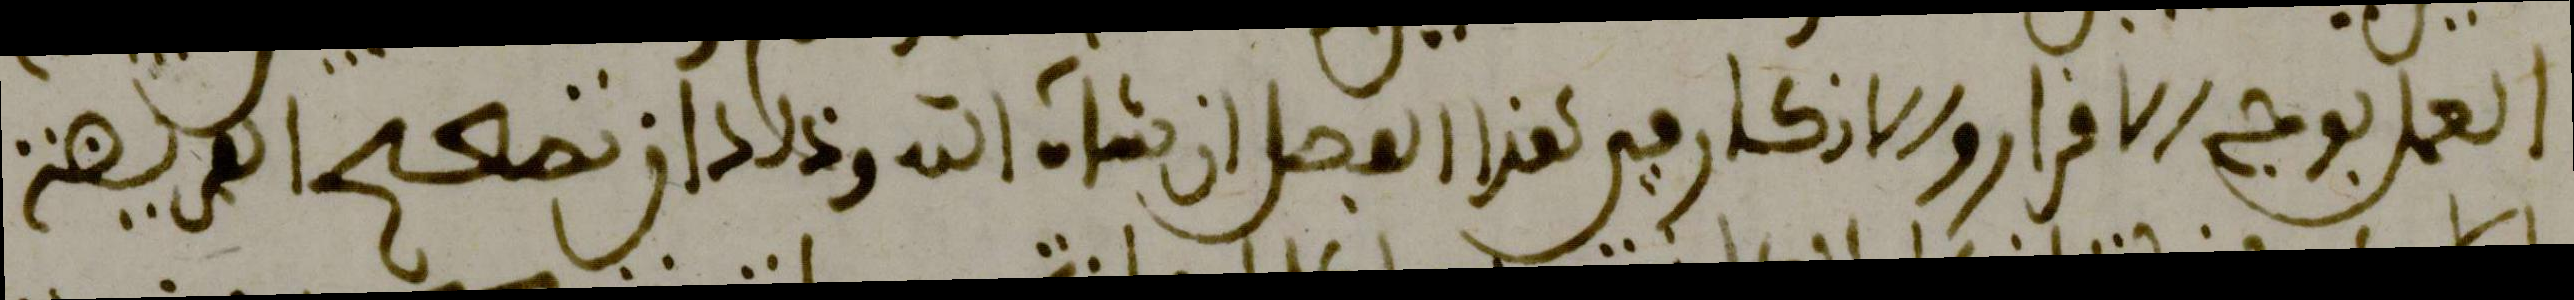العمل بوجه الاقرار والانكار في هذا الفصل ان شاء الله وذلك ان تصحح الفريضة
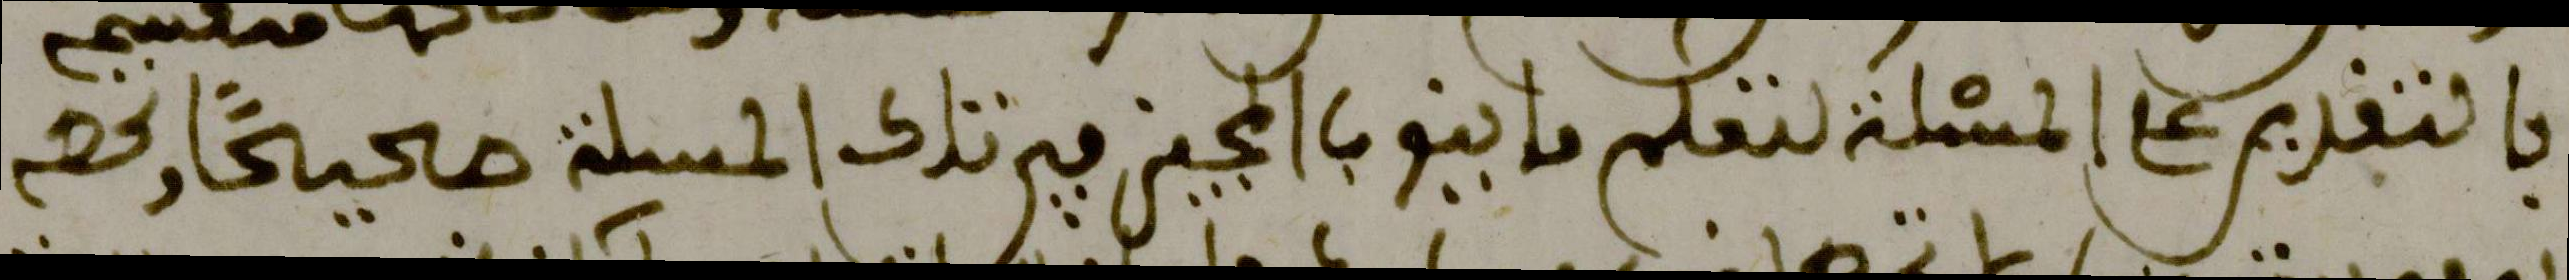بالتقدير على المسْلة لتعلم ما ينوب المجيز في تلك المسلة صحيحًا وتحطه
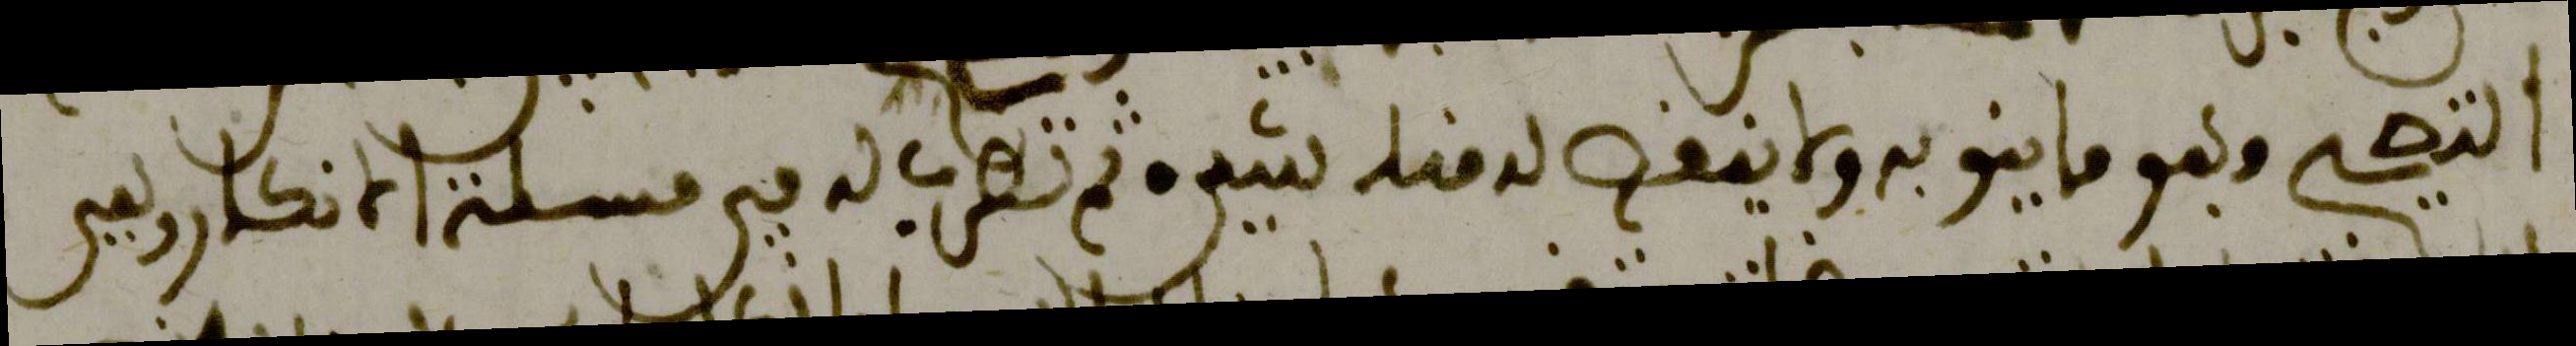التصحيح فهو ما ينو به ولا ينقص له منه شيء ثم تضرب له في مسلة الانكار وهي
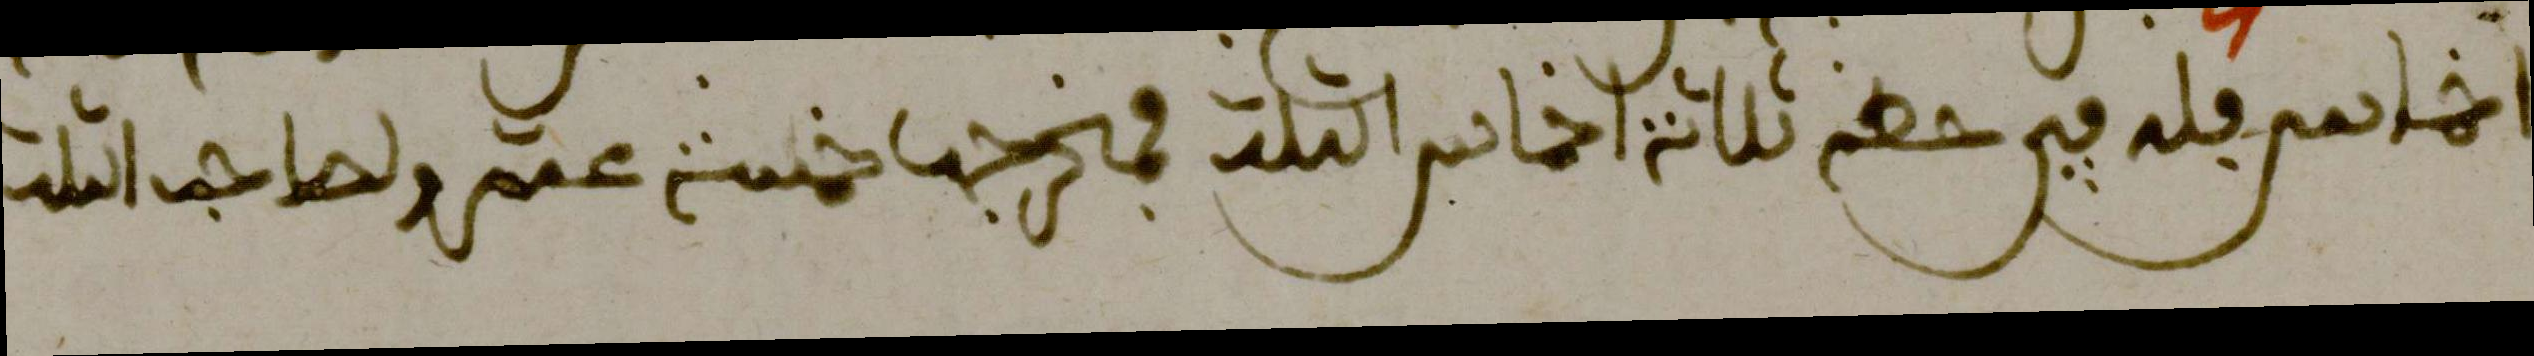اخماس فله في حظه ثلاثة اخماس الثلث فمخرجها خمسة عشر ولصاحب الثلث
